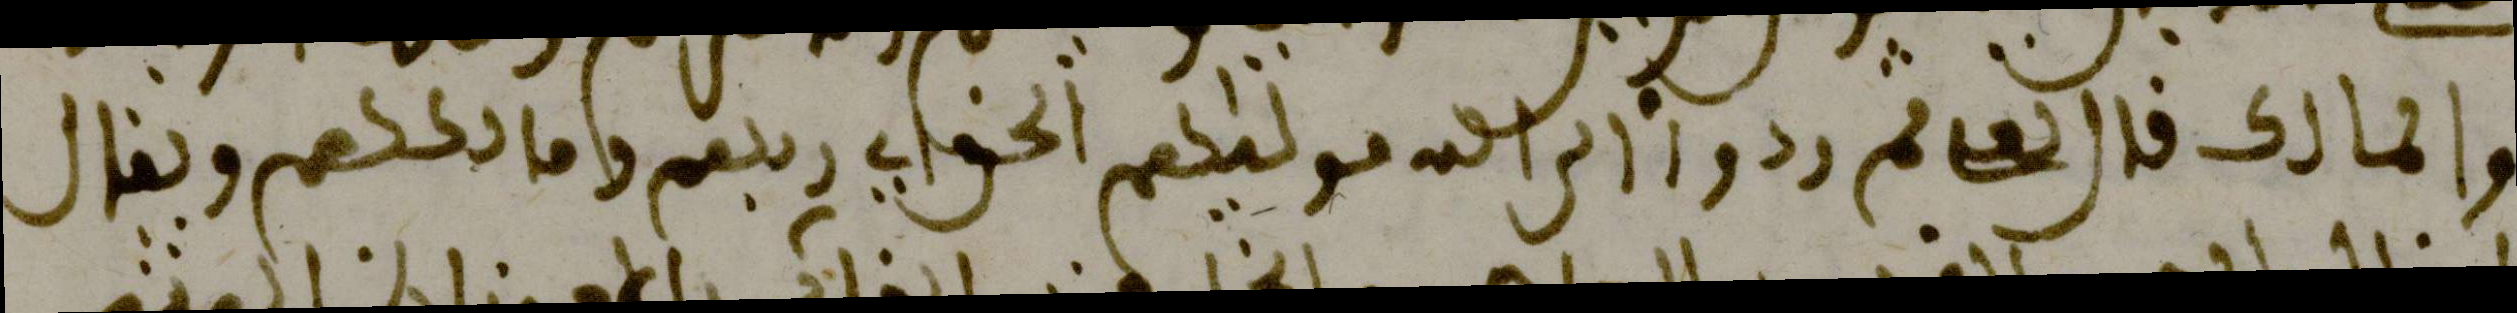والمالك قال تعلى ثم ردوا الى الله موليهم الحق اي ربهم ومالكهم ويقال
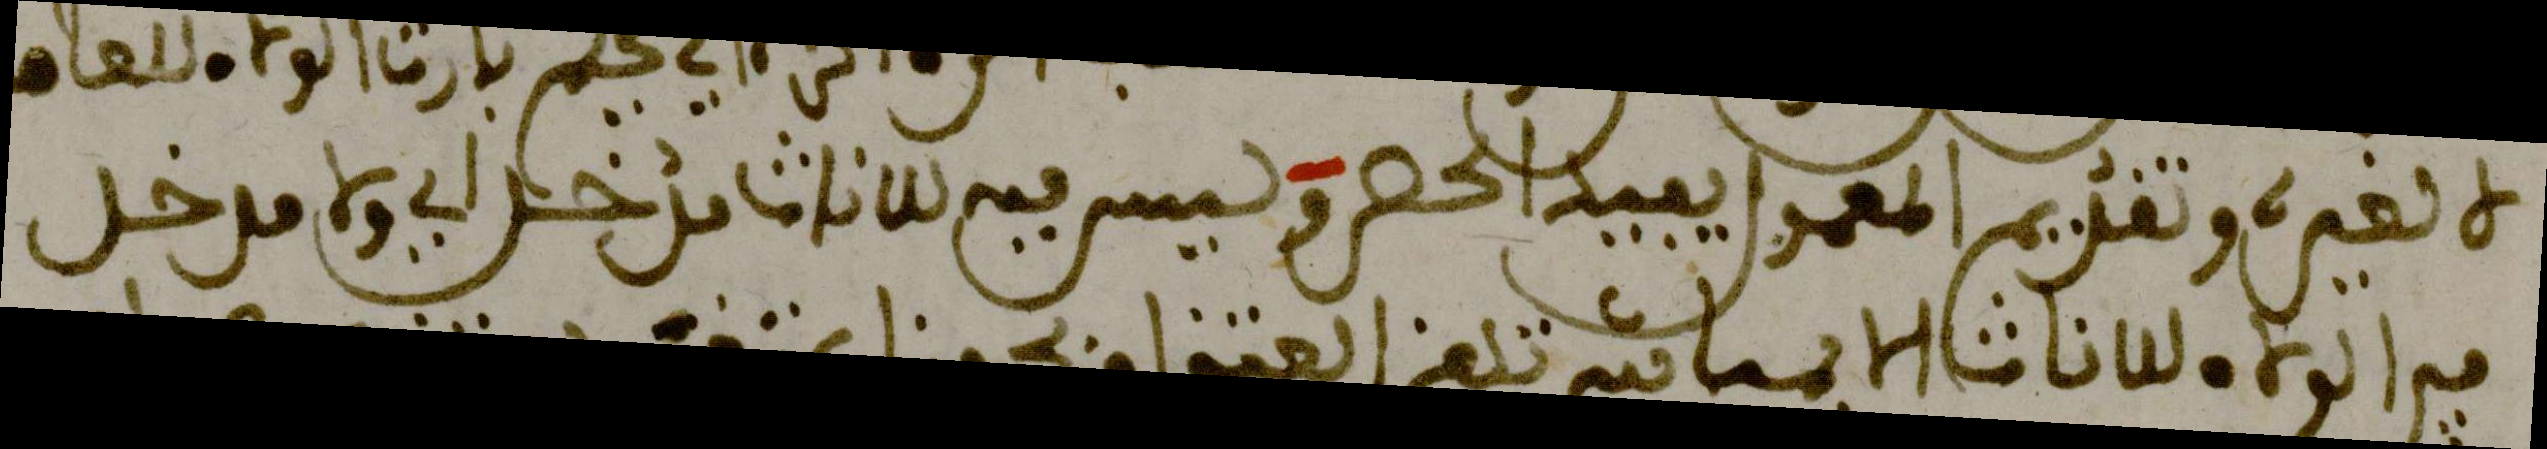لا لغيره وتقديم المعمول يفيد الحصر وَليس فيه للاناث مدخل اي ولا مدخل
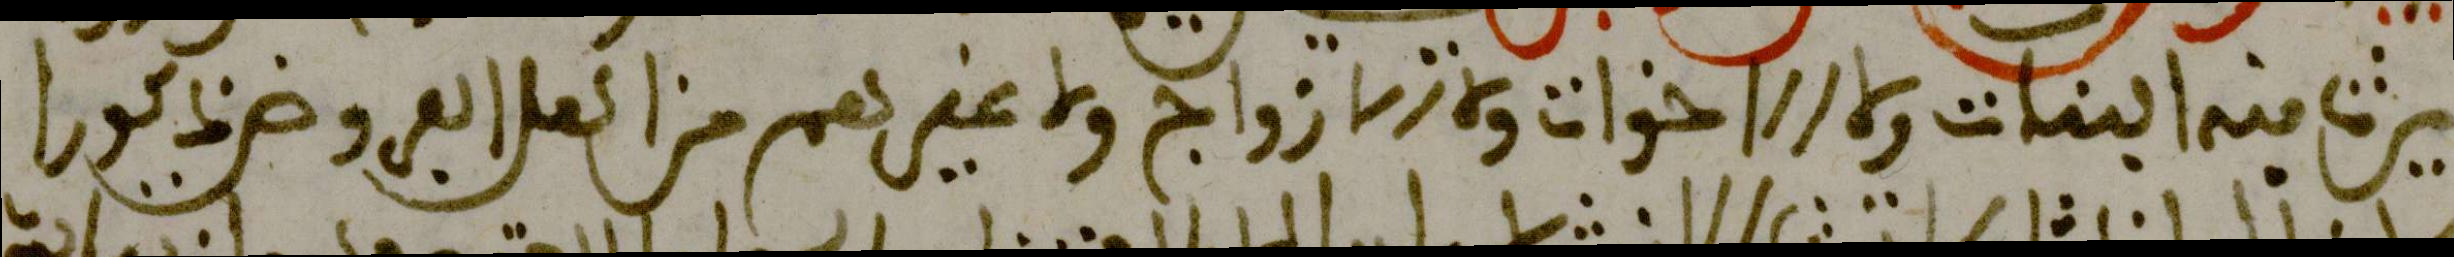يرث منه البنات ولا الاخوات ولا الازواج ولا غيرهم من اهل الفروض ذكورا
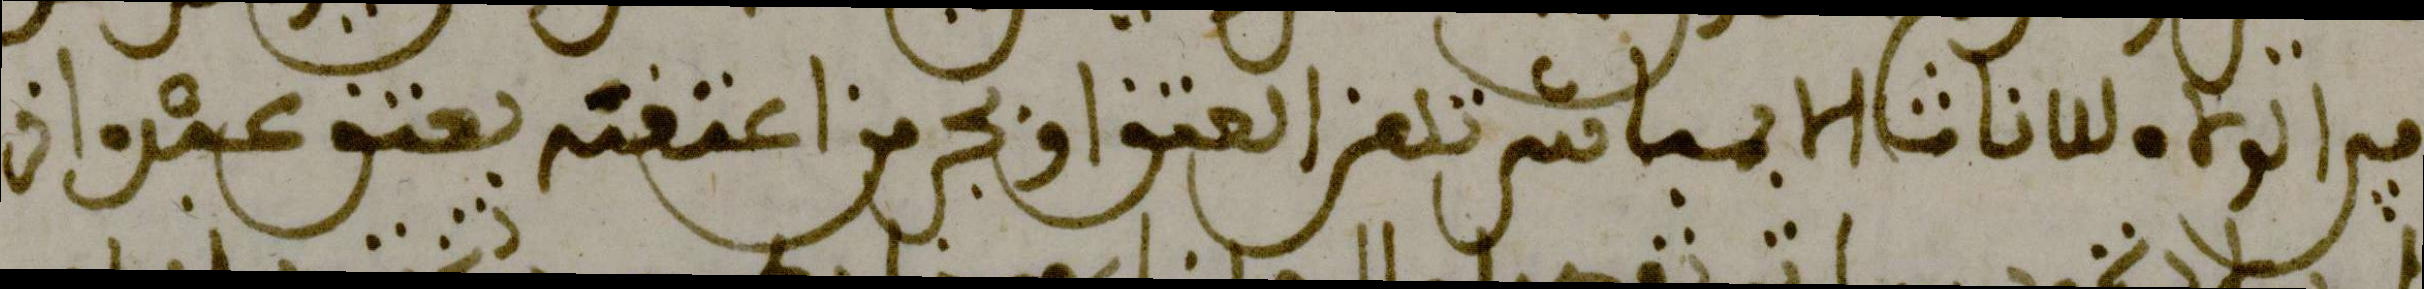في الولاء للاناث الا بمباشر تهن العتق او بجر من اعتقئه بعتق عبْد ءاخر
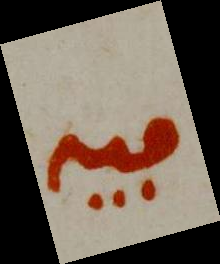فيه
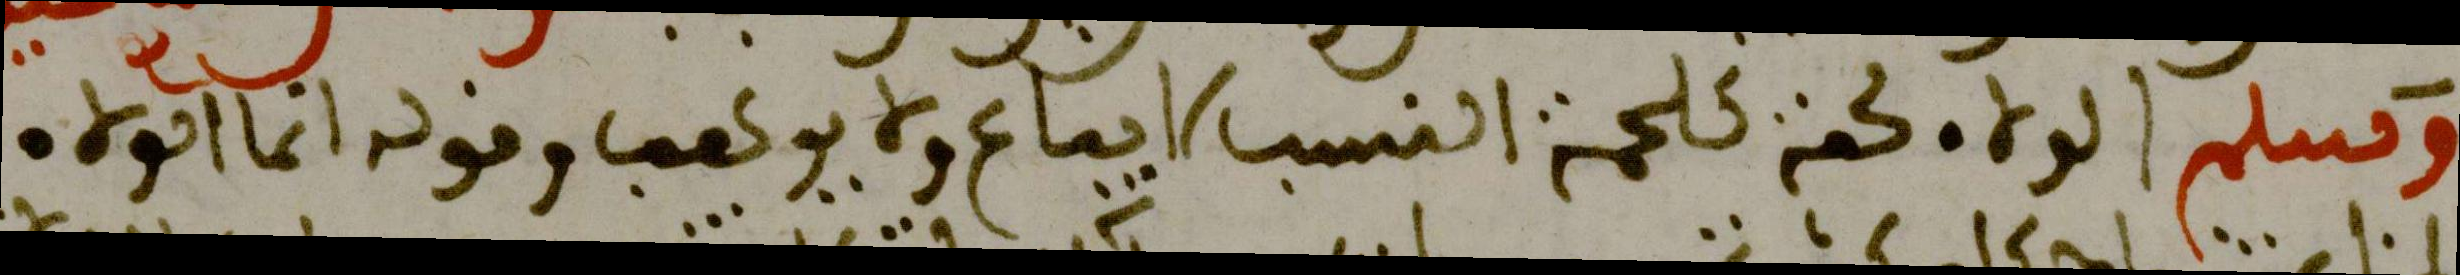وَسلم الولاء لحمة كلحمة النسب لا يباع ولا يوهب وقوله انما الولاء
